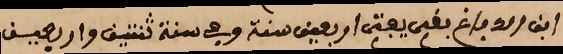ابن الدباغ بقي يفتي اربعين سنة وفي سنة ثنتين واربعين
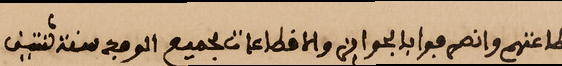طاعتهم وانصرفوا بالجوايز والاقطاعات لجميع الوفد سنة ثنتين
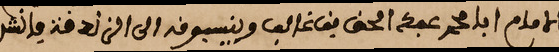الامام ابا محمد عبد الحق بن غالب وينسبونه الى الزندقة فانشد
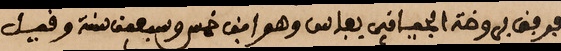فدفن بروضة الجياني بفاس وهو ابن خمس وسبعين سنة وقيل
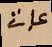عاتي
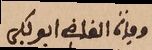وفاة القاضي ابو بكر
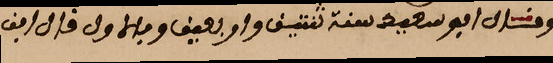وقال ابو سعيد سنة ثنتين واربعين وبالاول قال ابن
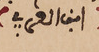ابن العربي
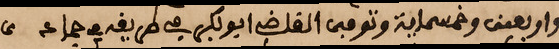و اربعين وخمسماية وتوفي القاضي ابو بكر في طريقه في جمادى
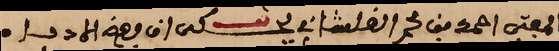المفتي احمد بن محمد القلشاني يحكى ان بعض الادباء
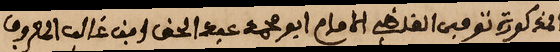المذكورة توفي القاضي الامام ابو محمد عبد الحق ابن غالب المعروف
